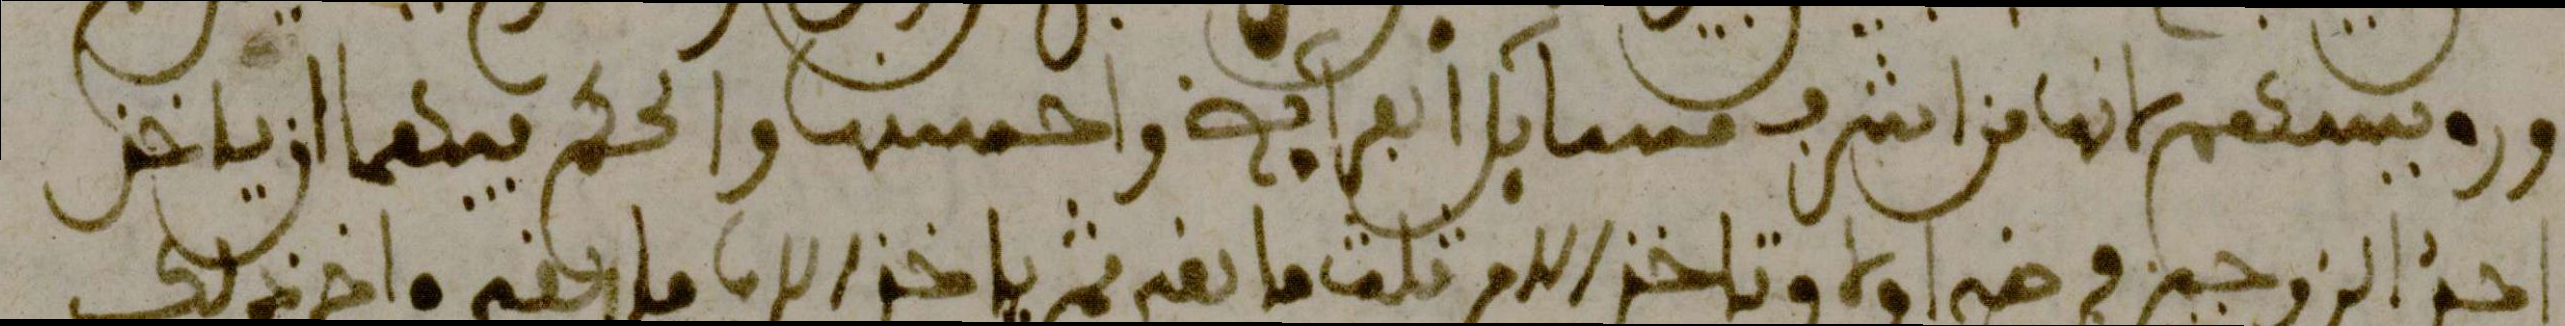ورءيسهم لانها من اشرف مسائل الفرائض واحسنها والحكم فيهما ان ياخذ
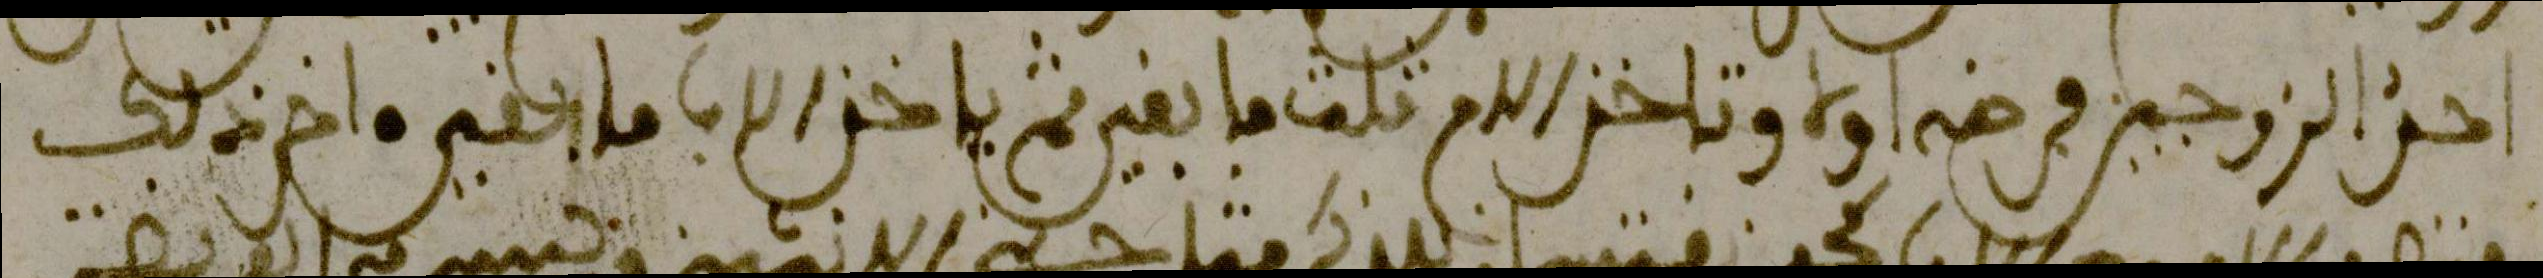احد الزوجين فرضه او لا وتاخذ الام ثلث ما بقي ثم ياخذ الاب ما بقي ءاخر ذلك
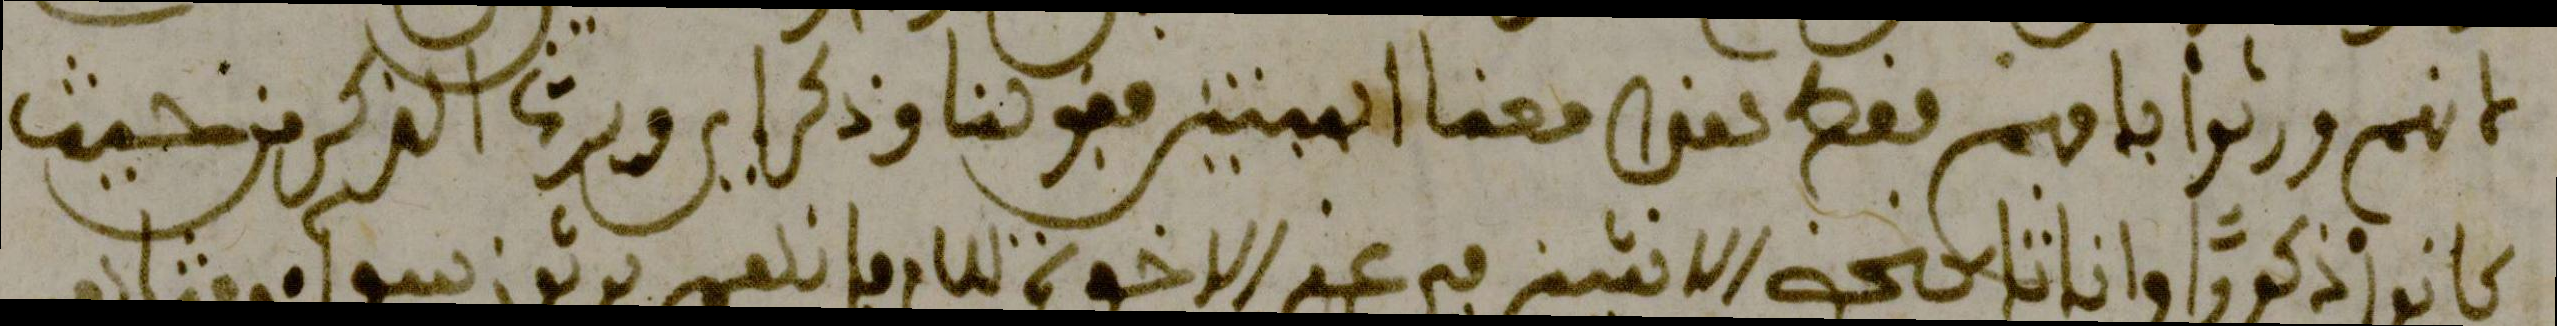لانهم ورثوا بامهم فقط هذه معنا البيتين فقولنا وذكر اي ويرث الذكر من حيث
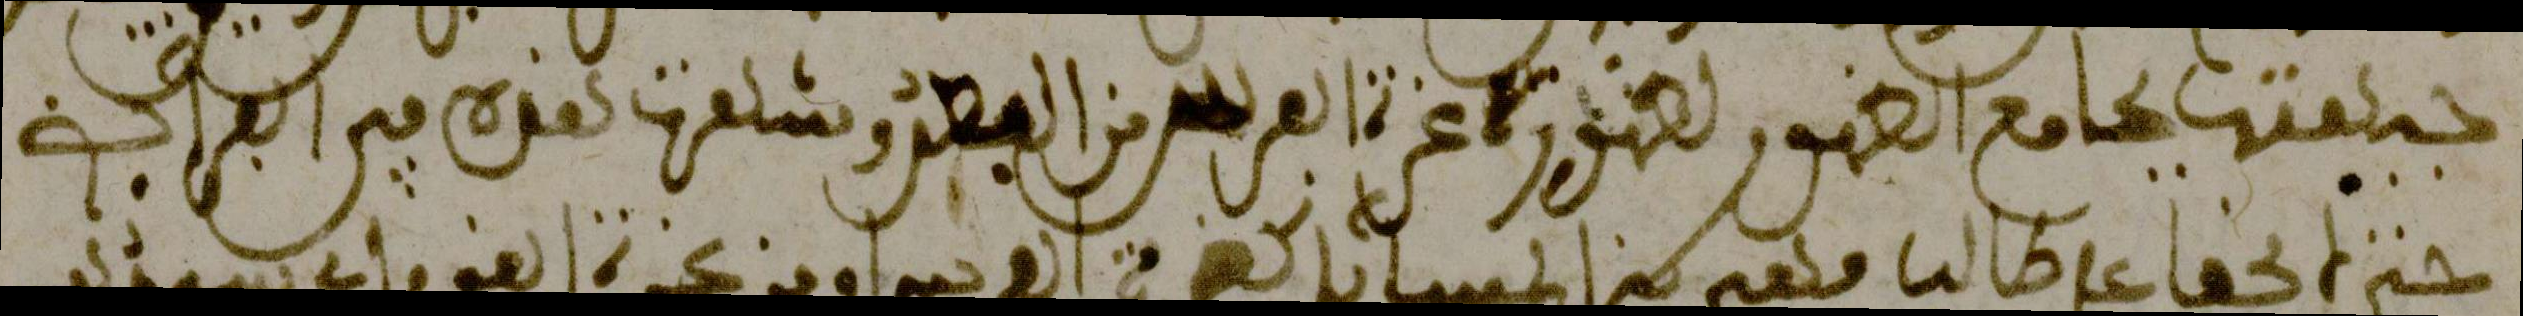جبهتها بجامع الظهور لظهور لا غرة الفرس من البعد وشهرت هذه في الفرائض
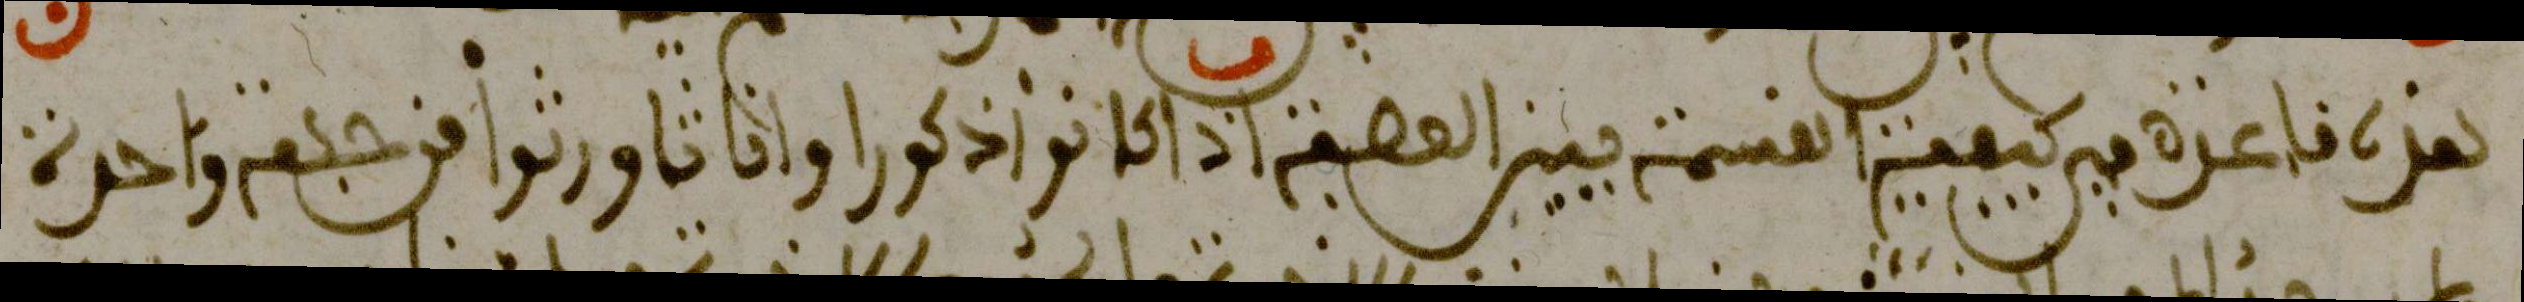هذه قاعدة في كيفية القسمة بين العصبة اذا كانوا ذكورا وان ثاورثوا من جهة واحدة
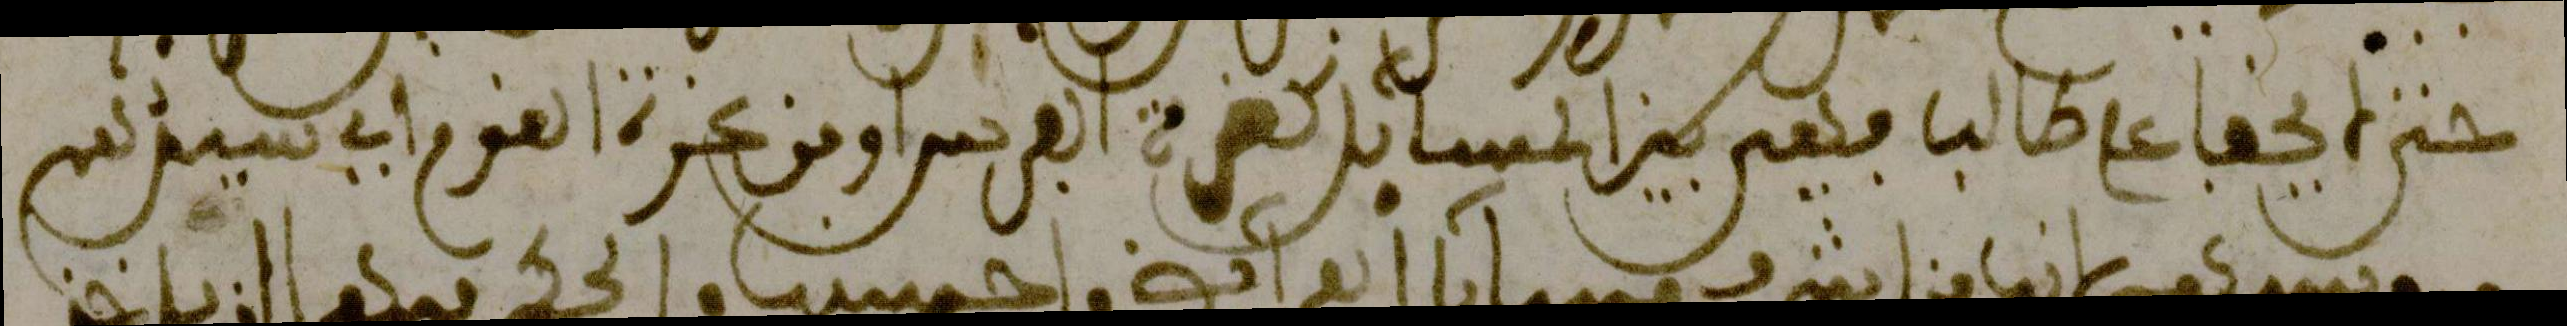حتى لا يخفا على طالب فهي بين المسائل كغرة الفرس او من غرة القوم اي سيدهم
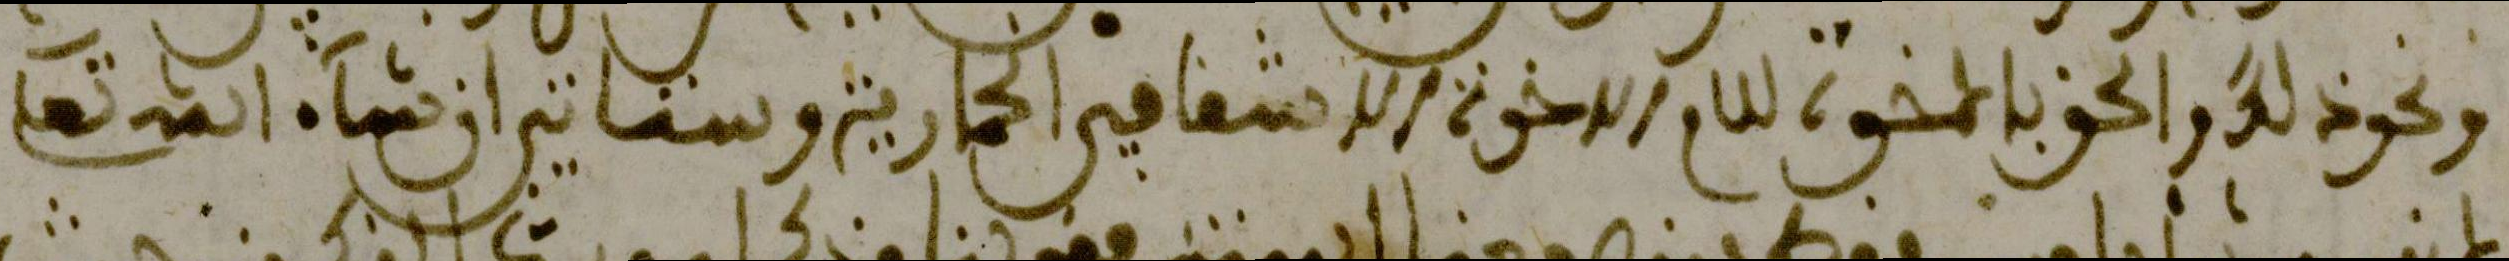ونحو ذلك والحق بالاخوة للام الاخوة الاشقا في الحمارية وستاتي ان شاء الله تعلى
